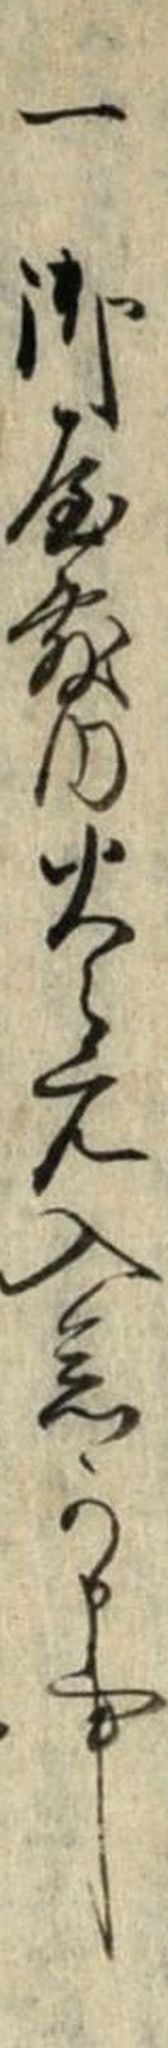一御屋敷内火之元入念可申事
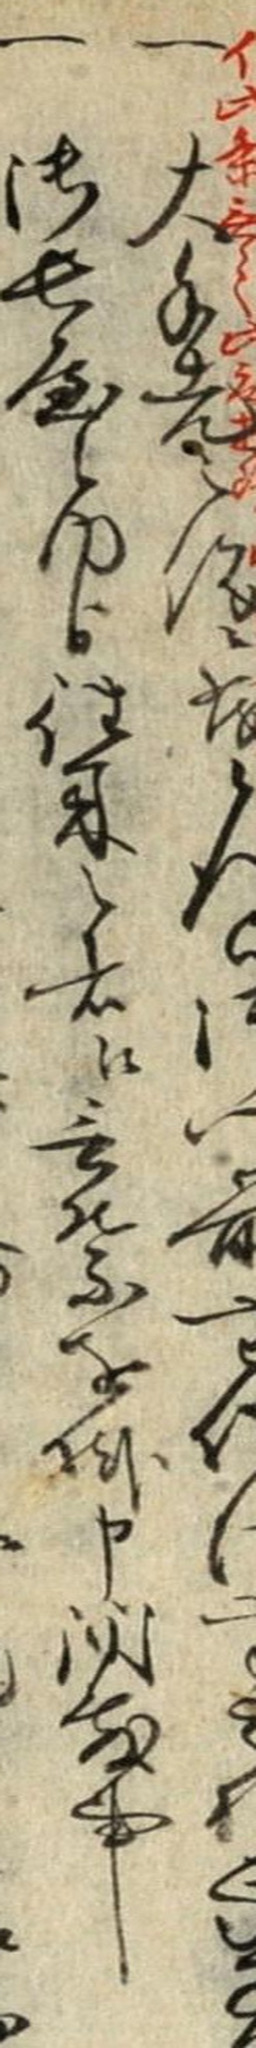一御長屋之内ゟ往来之者江言葉を掛申間敷事
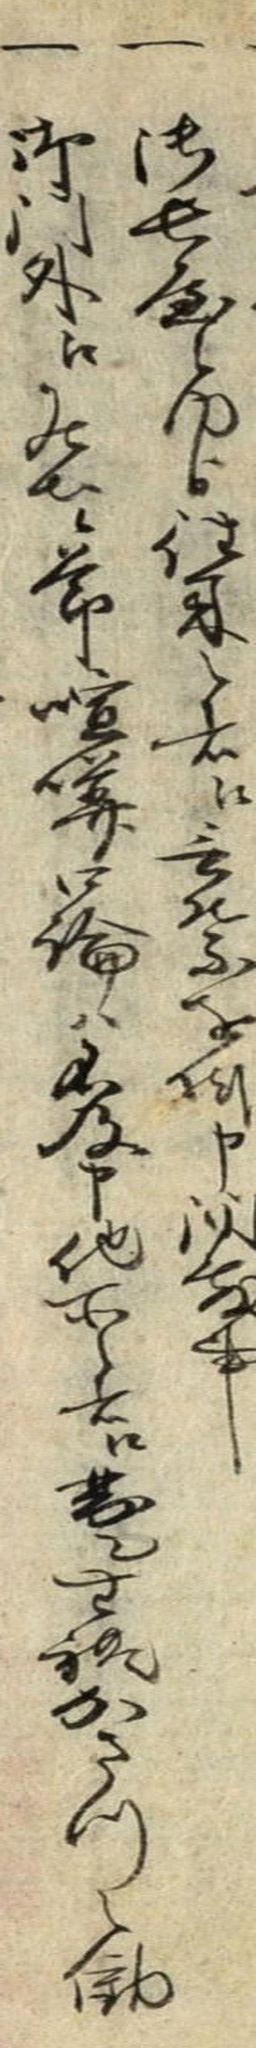一御門外江罷出候節喧嘩口論ハ不及申他所之者江対シ無礼かさつ之働
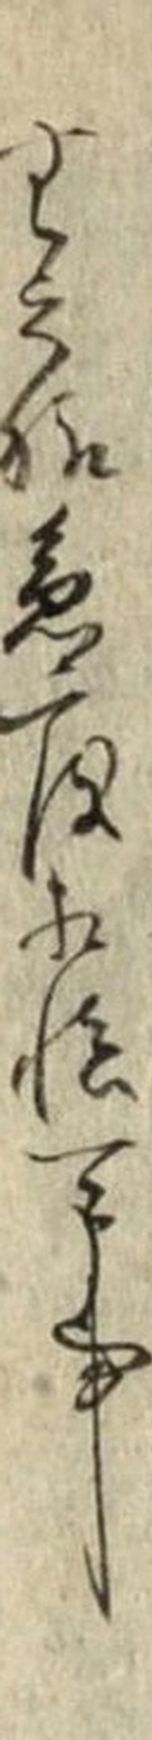無之様急度相慎可申事
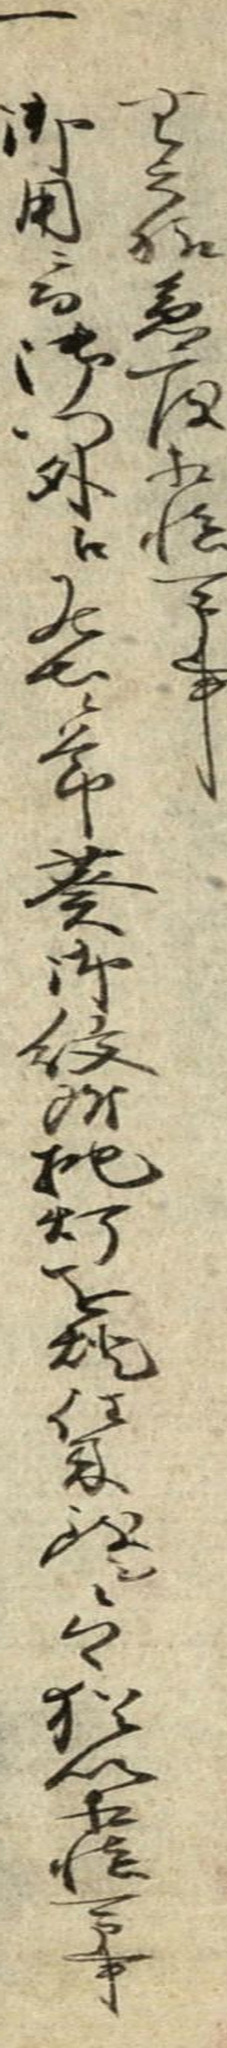一御用ニ而御門外江罷出候節葵御紋附提灯を灯往来致シ候ハヽ猶以相慎可申事
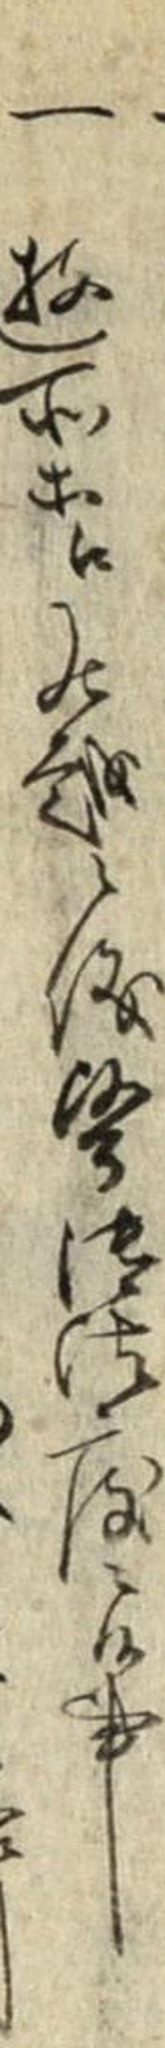一遊所等江罷越候儀堅御法度ニ候事
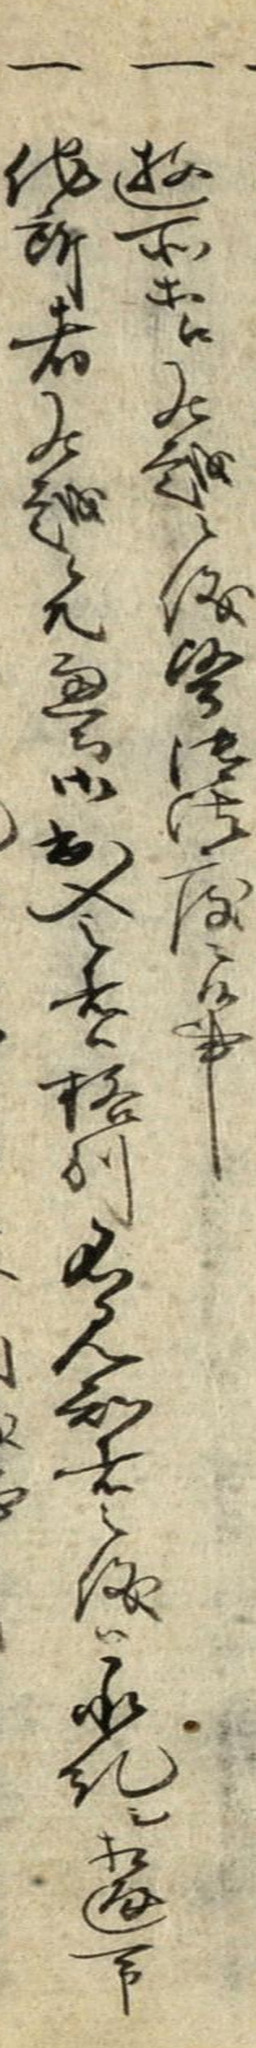一他所者罷越候共兼而御出入之者ハ格別不見知者之儀ハ承糺シ相通可申
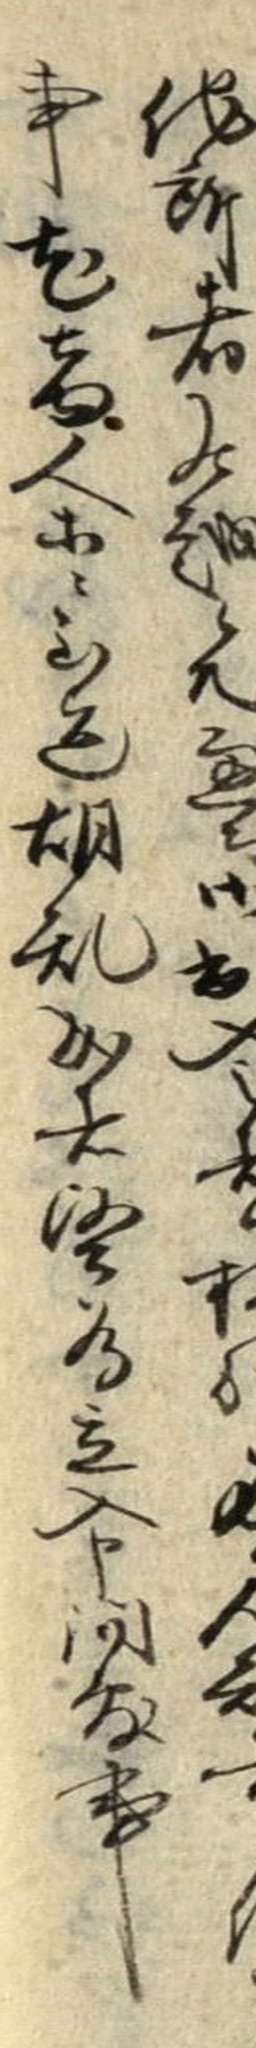事尤商人等ニ至迄胡乱成者堅為立入申間敷事

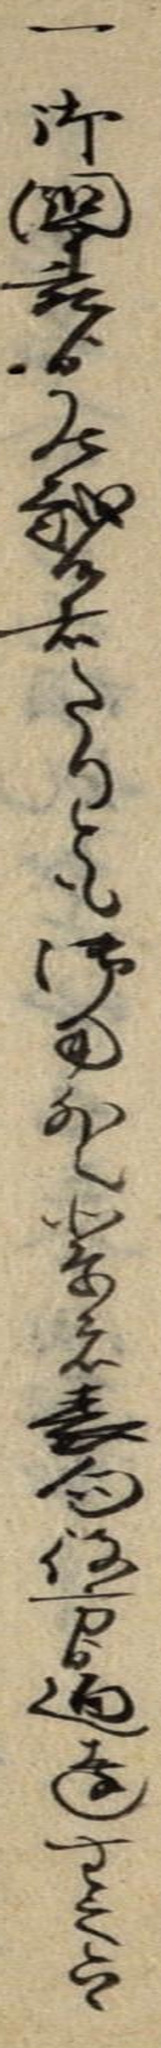一御国表ゟ罷越候者たりとも御用外之輩者表向役方ゟ通達無之候ハヽ
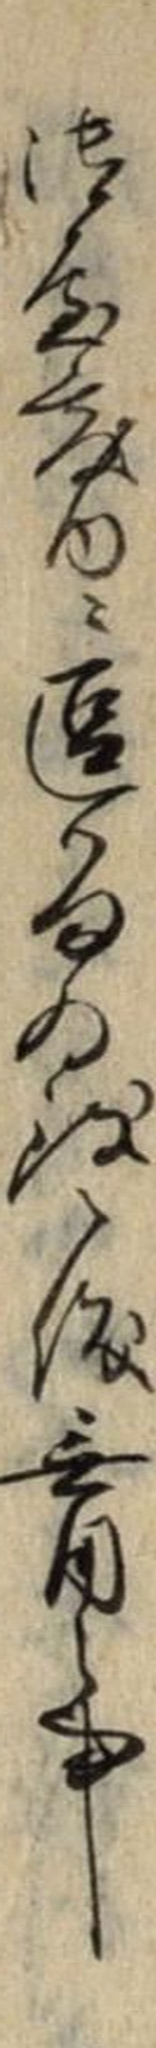御屋敷内ニ逗留為致候儀無用之事
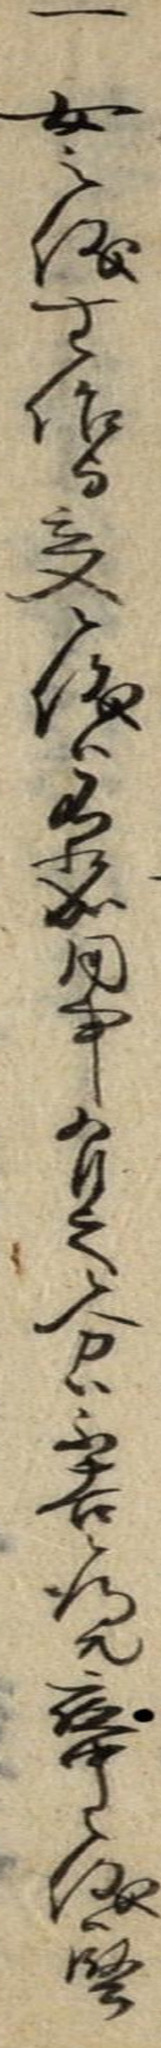一女之儀無作与立入候儀ハ不相成用事有之候分ハ不苦候得共夜中之儀ハ堅
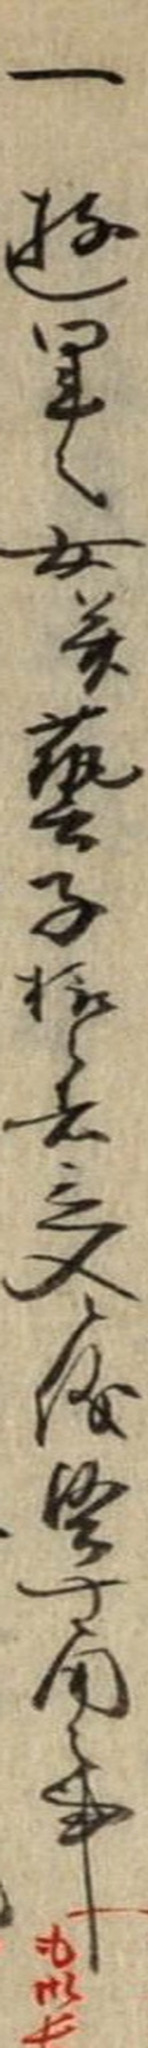一遊里之女并芸子様之者立入候儀堅無用之事
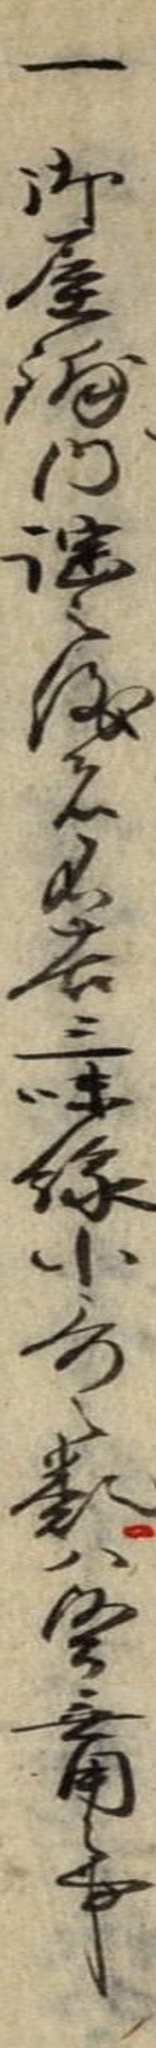一御屋鋪内謡之儀者不苦三味線小哥之類◦ハ堅無用之事
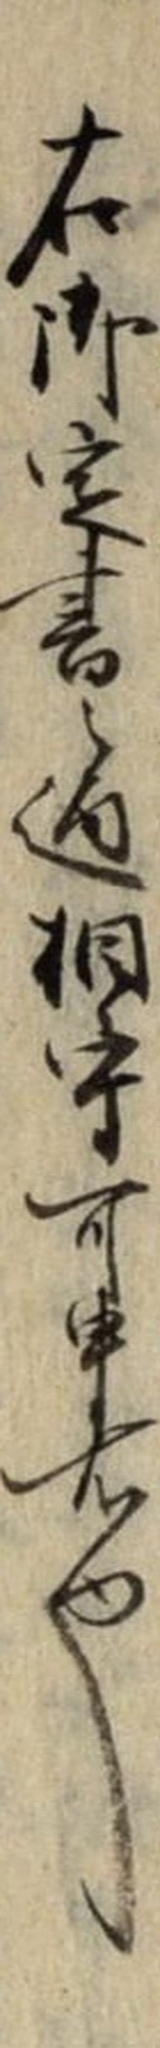右御定書之通相守可申者也
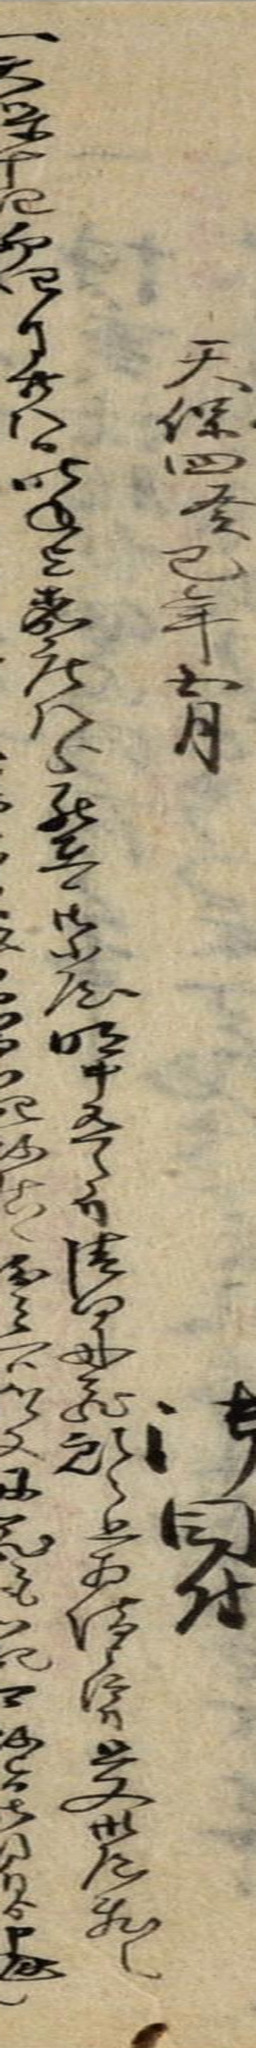一天保十四卯四月廿八日昨年迄森庄八郎罷在候御小屋明キ有之ニ付清田丹蔵願之上拝借被仰付且又御屋敷之
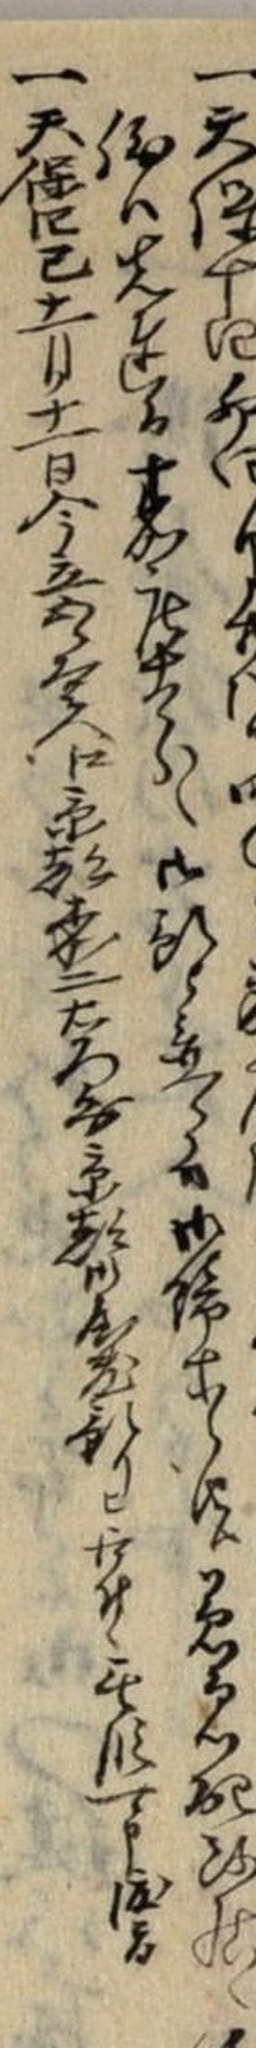一天保四巳十一月十一日今立五郎太夫江京都森二右衛門義京都御屋敷預り被仰付候其段可申度旨
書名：三都并道中之部
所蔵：福井県文書館 Fukui Prefectural Archives
